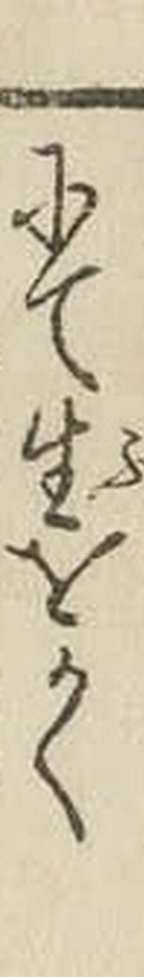にて生をかく
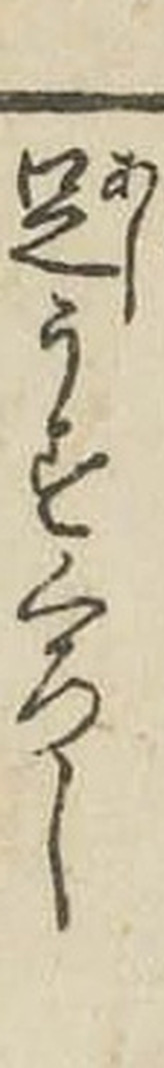足うすくろし
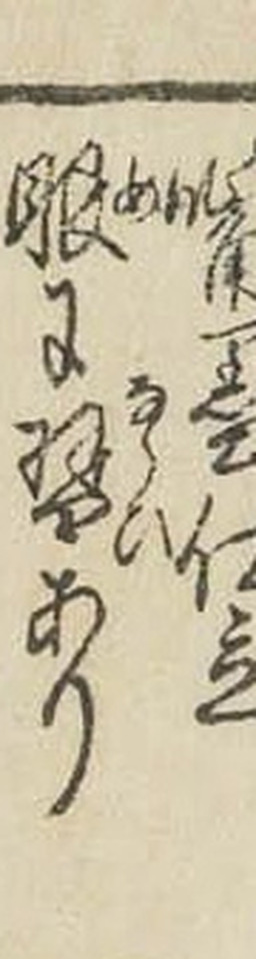眼に習あり
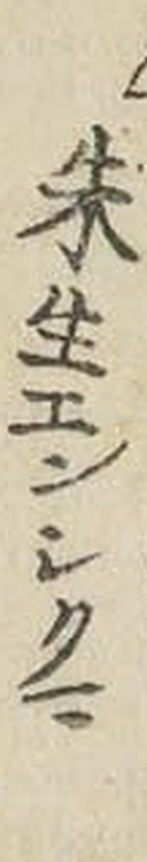朱生エンシクマ
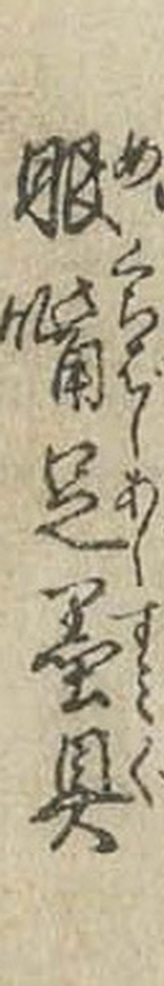眼嘴足墨具
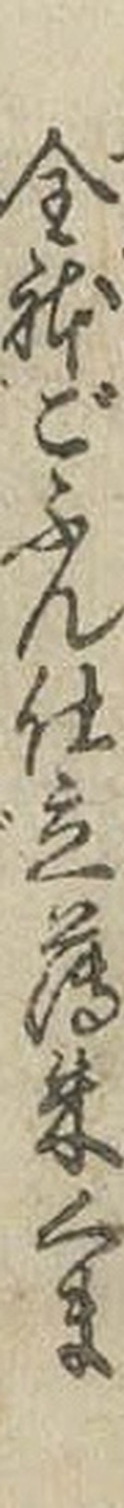全体ごふん仕立薄朱くま

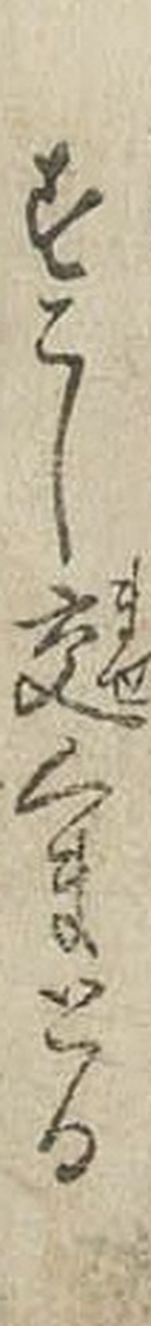すこし交くまとる
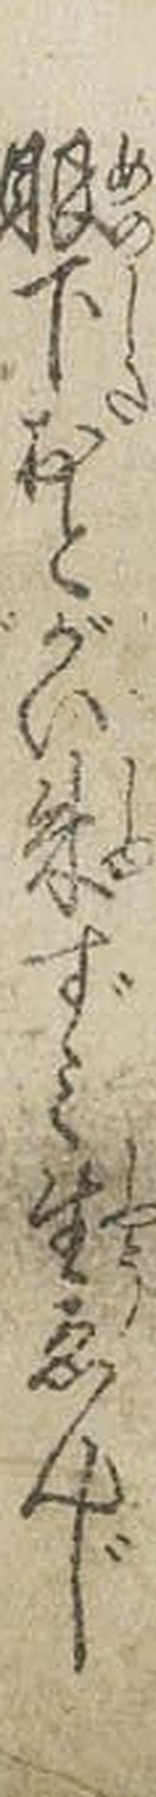眼下おとがい朱ずみ生ゑんじ
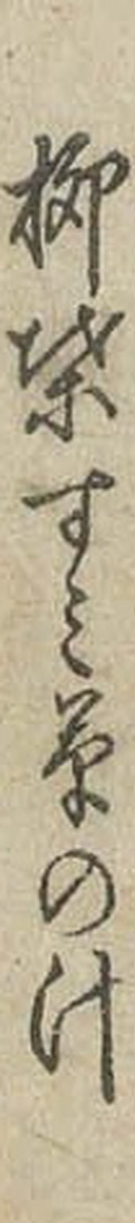燕柳葉すみ草の汁

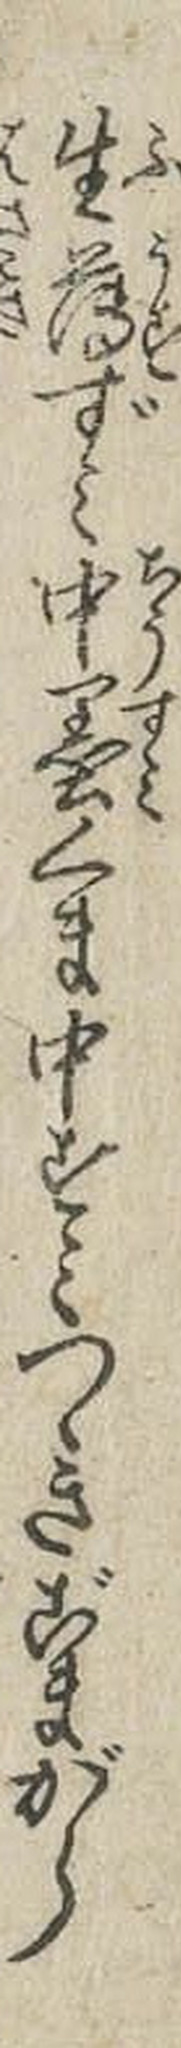生薄ずみ中墨くま中すみつゝきごまがら
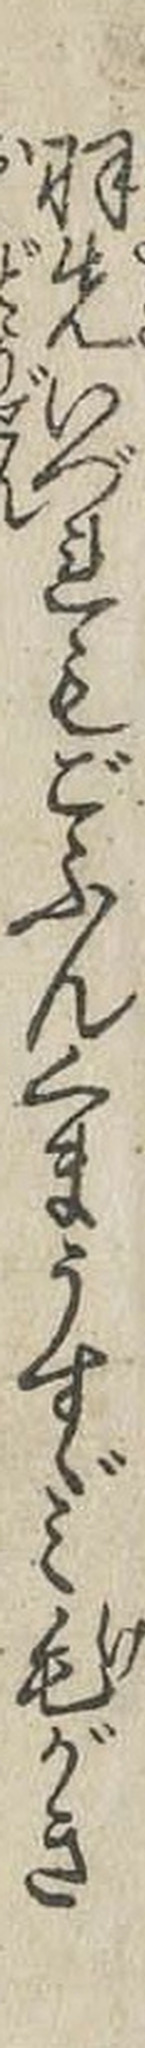羽先いづれもごふんくまうすゞみ毛がき
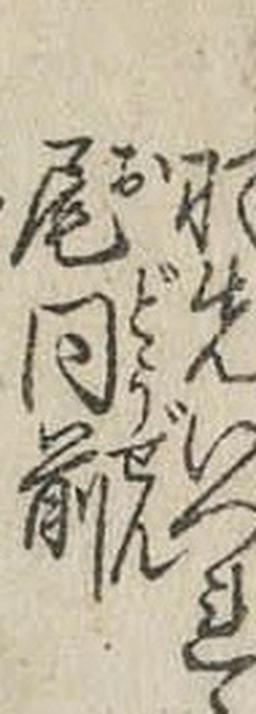尾同前
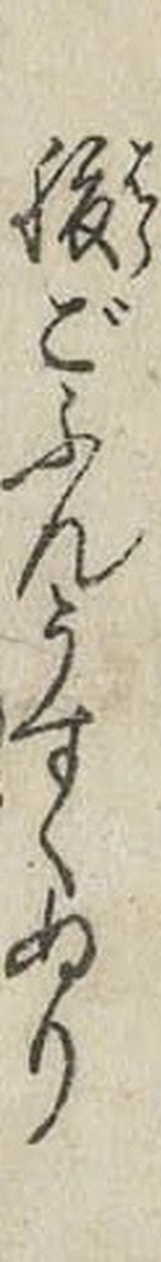腹ごふんうすくぬり
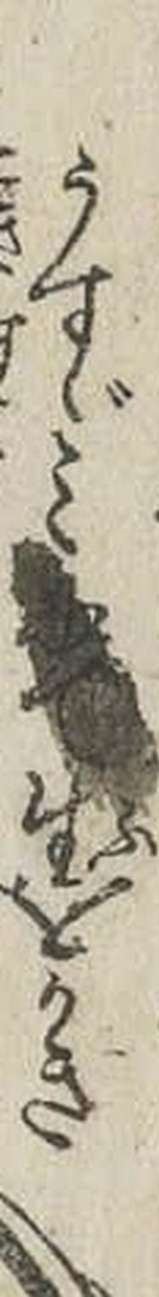うすゞみにて生をかき
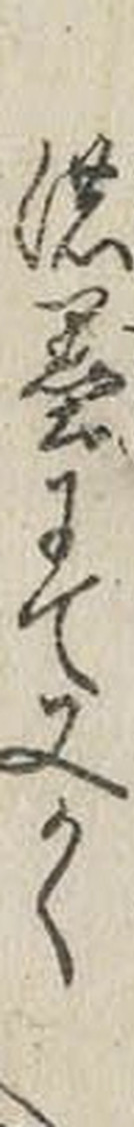濃墨にて又かく
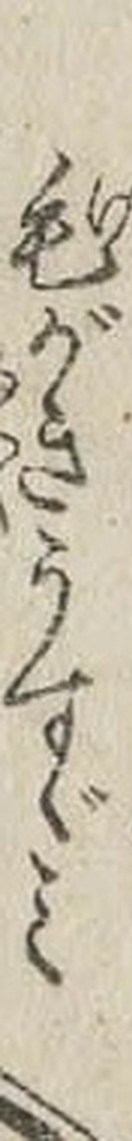毛がきうすゞみ
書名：絵本写宝袋 9巻 8之巻
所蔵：東京学芸大学教育コンテンツアーカイブ
